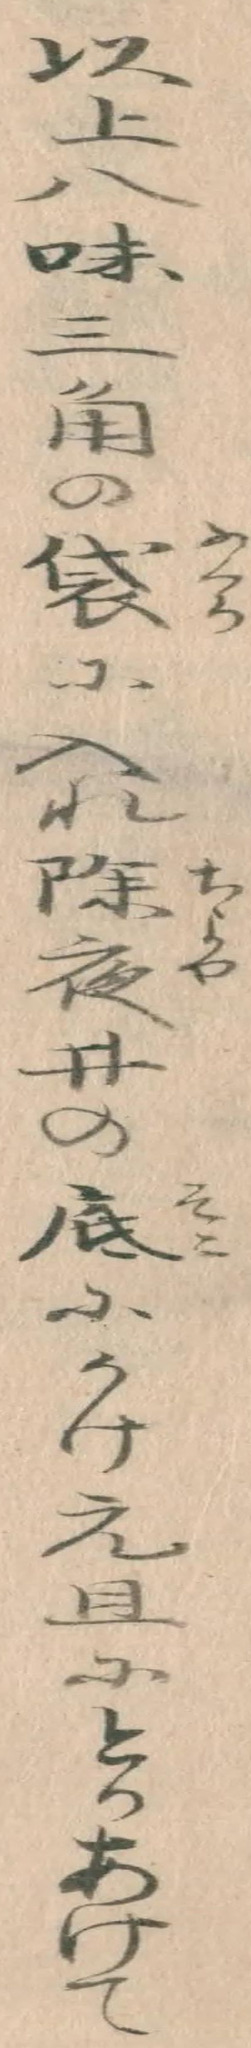以上八味三角の袋に入れ除夜井の底にかけ元旦にとりあけて
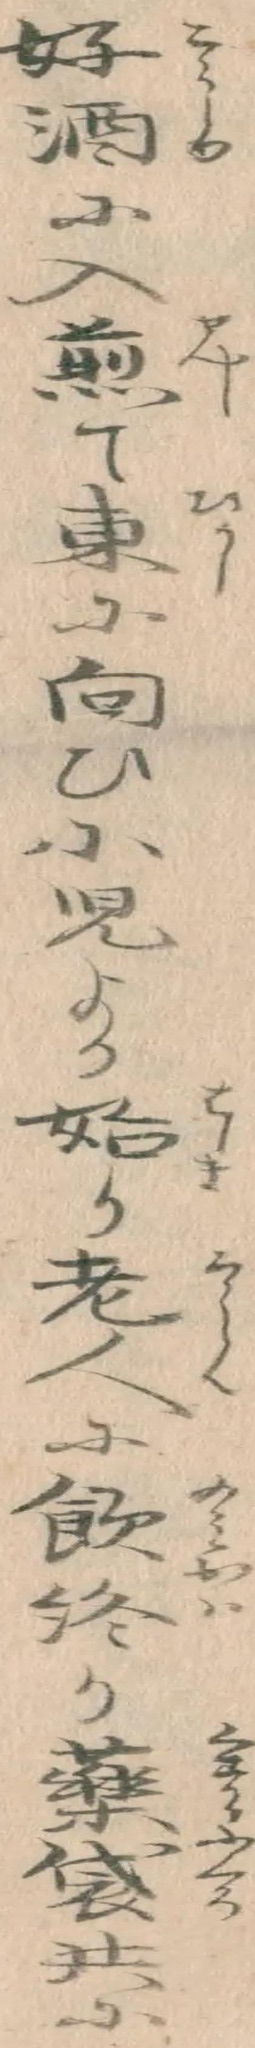好酒に入煎て東に向ひ小児より始り老人に飲終り薬袋共に
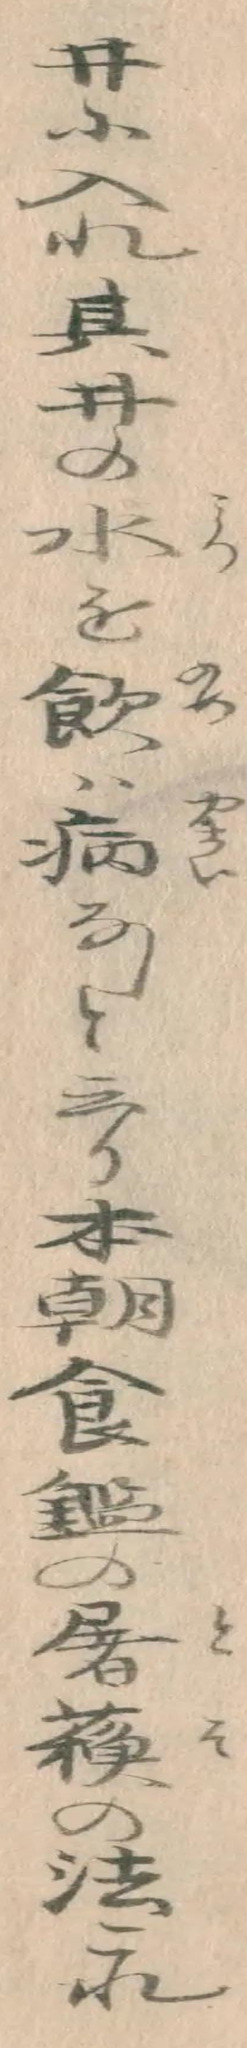井に入れ其井の水を飲は病なしと云り本朝食鑑の屠蘇の法これ
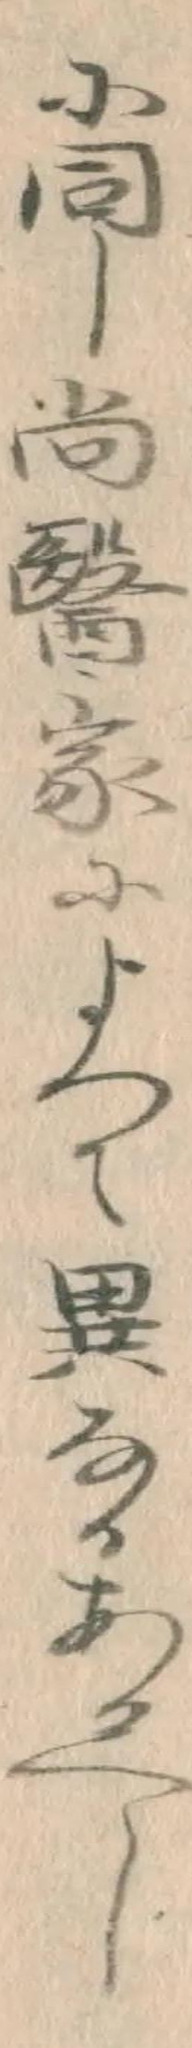に同し尚医家によつて異なるあるへし
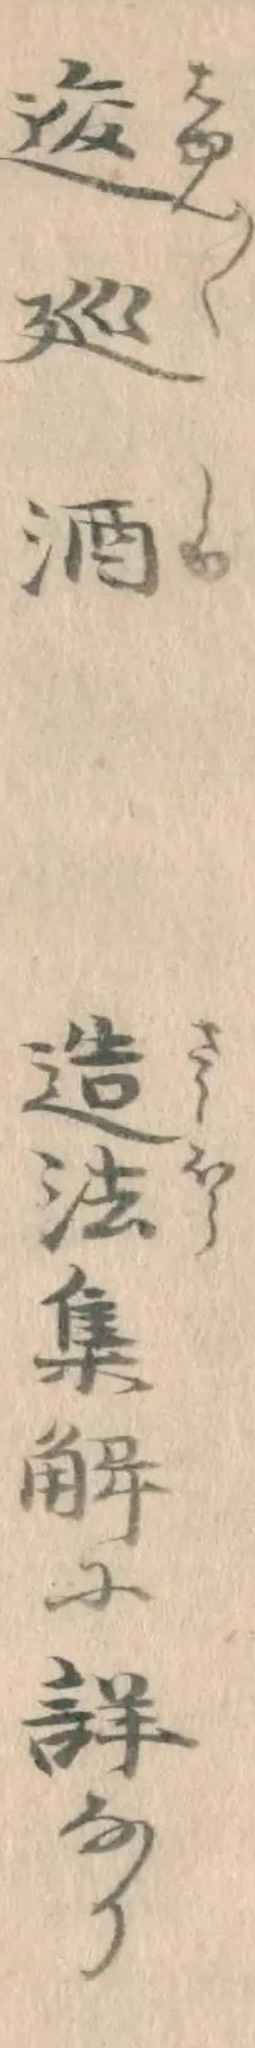愈瘧酒造法集解に詳なり
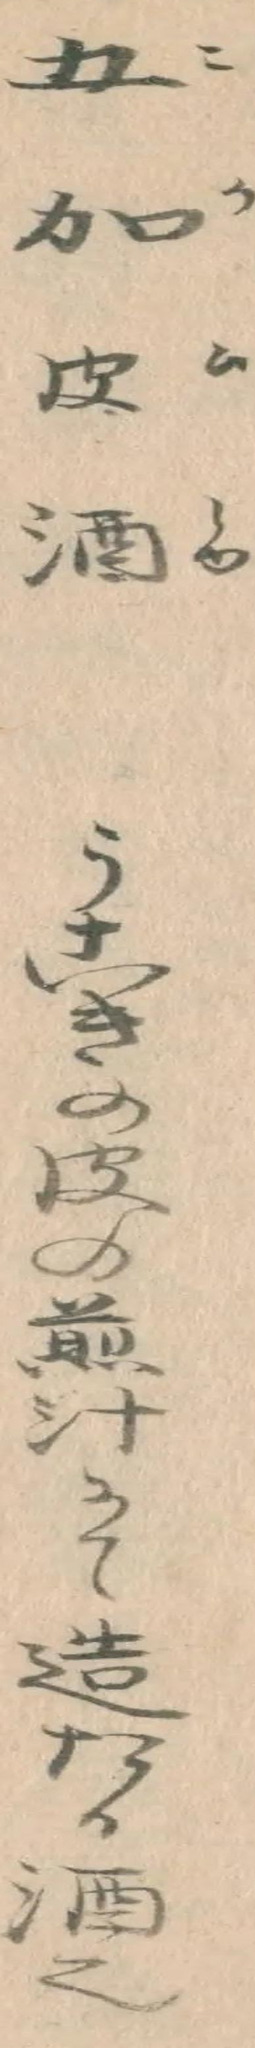五加皮酒うこきの皮の煎汁にて造たる酒也

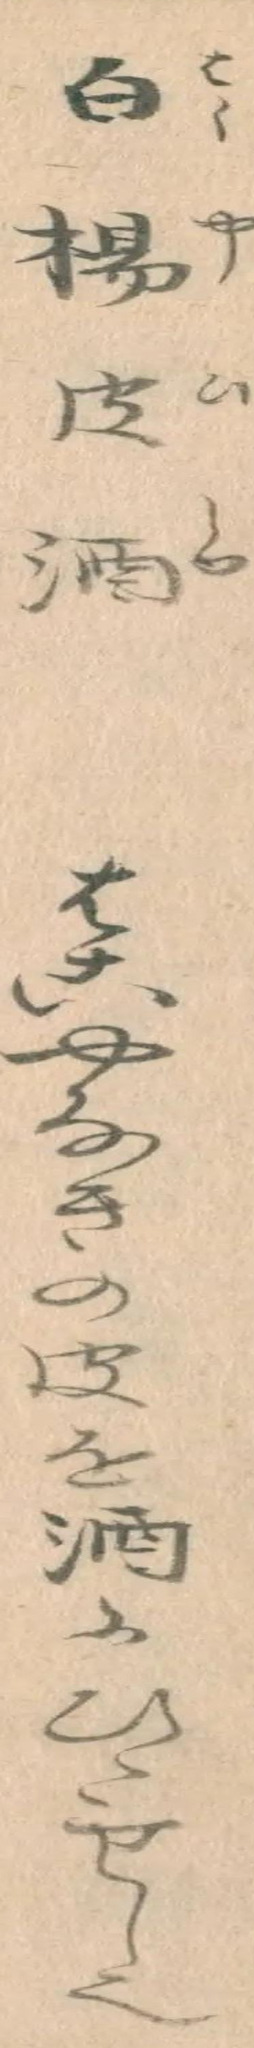白楊皮酒はこやなきの皮を酒にひたせし也
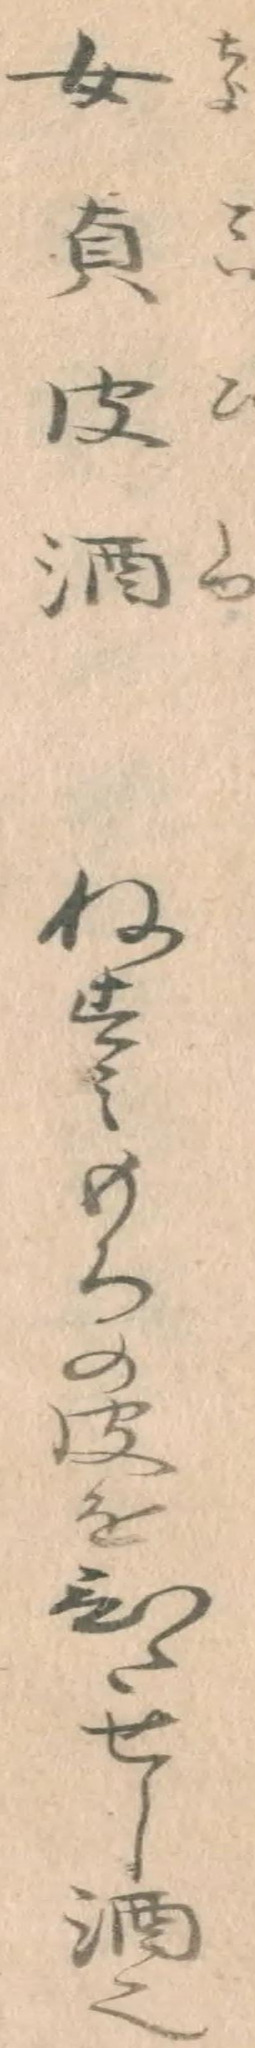女貞皮酒ねすみもちの皮をひたせし酒也
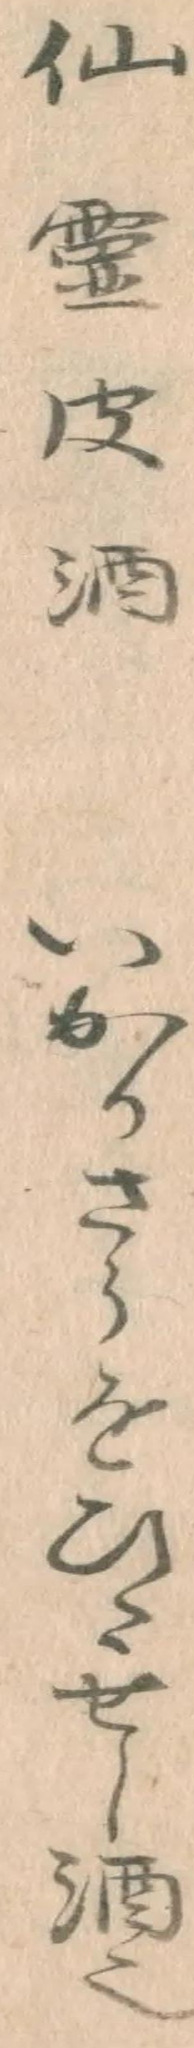仙霊皮酒いかりさうをひたせし酒也
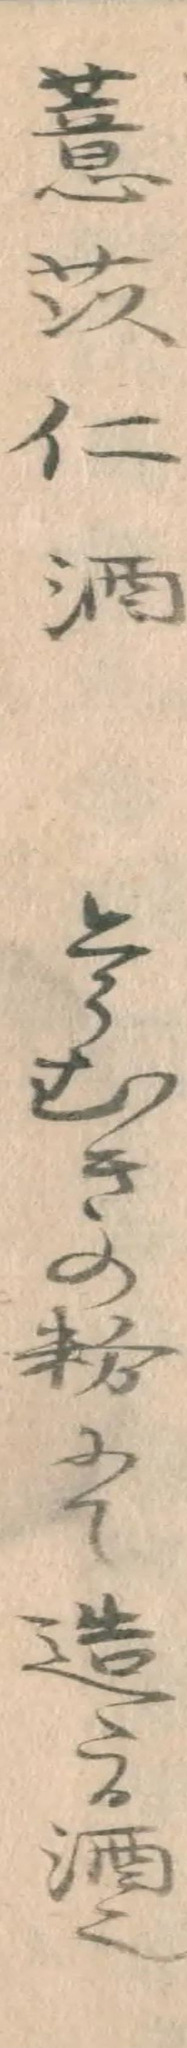薏苡仁酒とうむきの粉にて造たる酒也
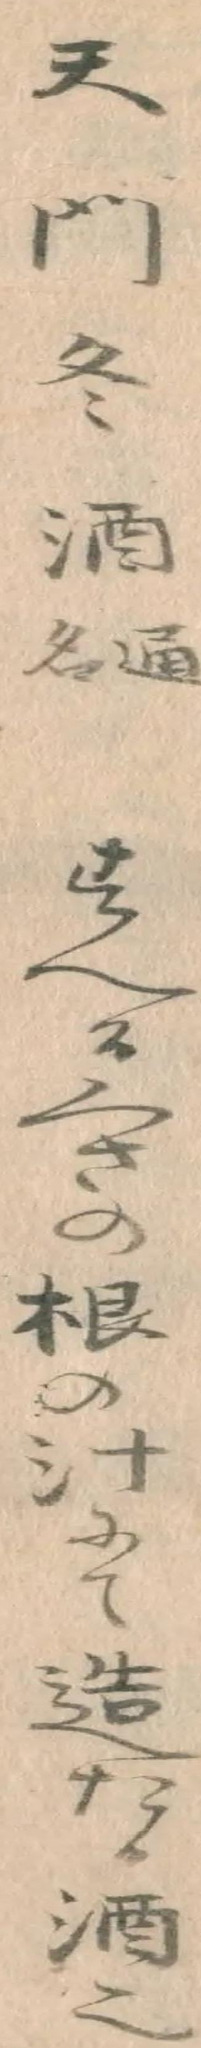天門冬酒通名すへるくさの根の汁にて造たる酒也
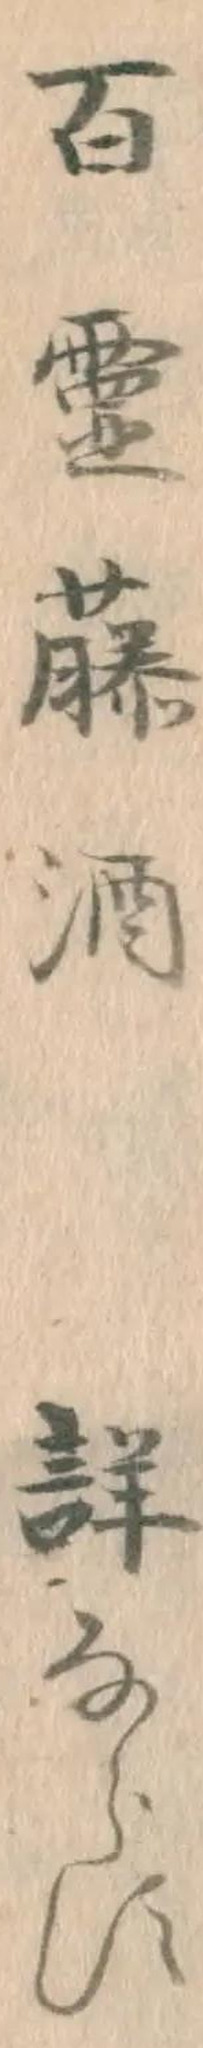百霊藤酒詳ならす
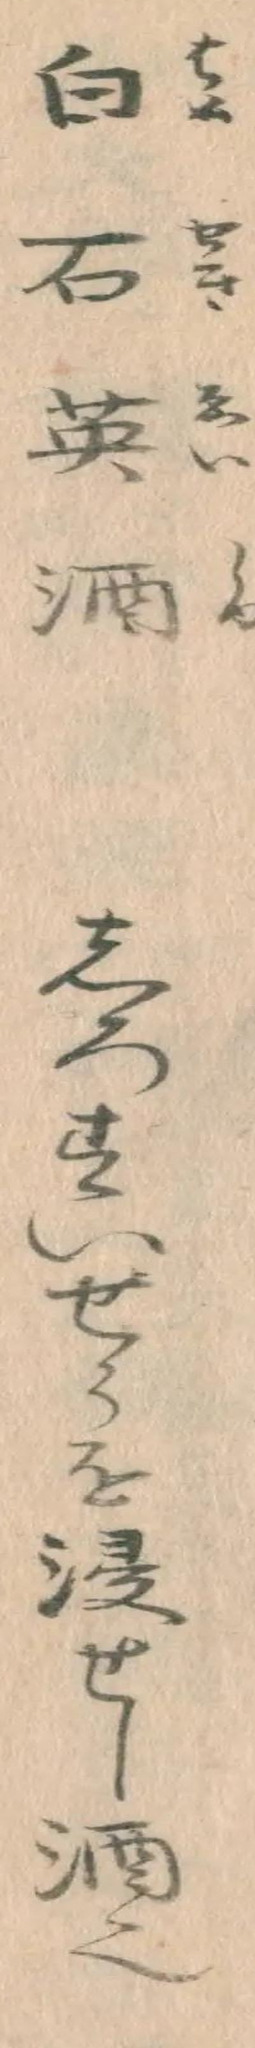白石英酒しろすいせうを浸せし酒也
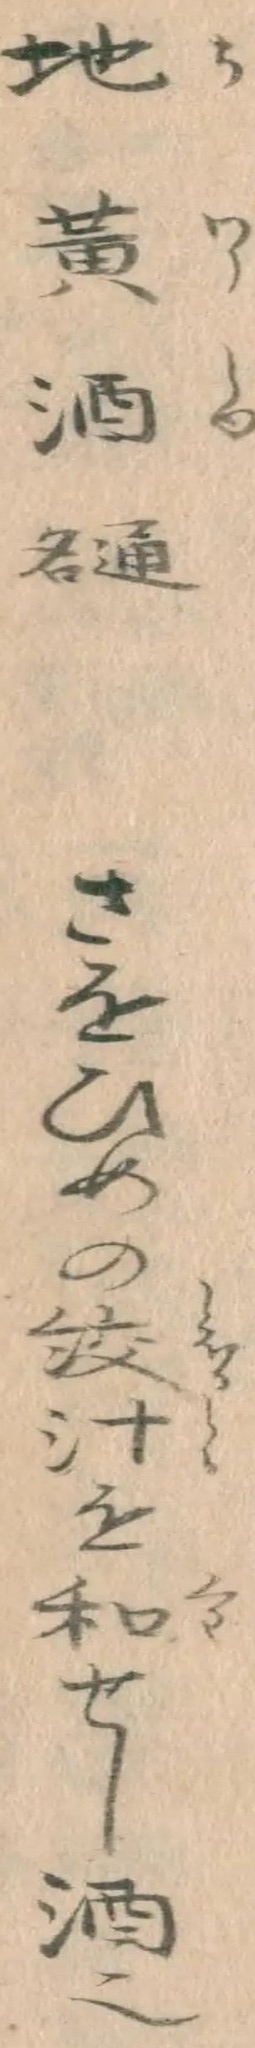地黄酒通名さをひめの絞汁を和せし酒也
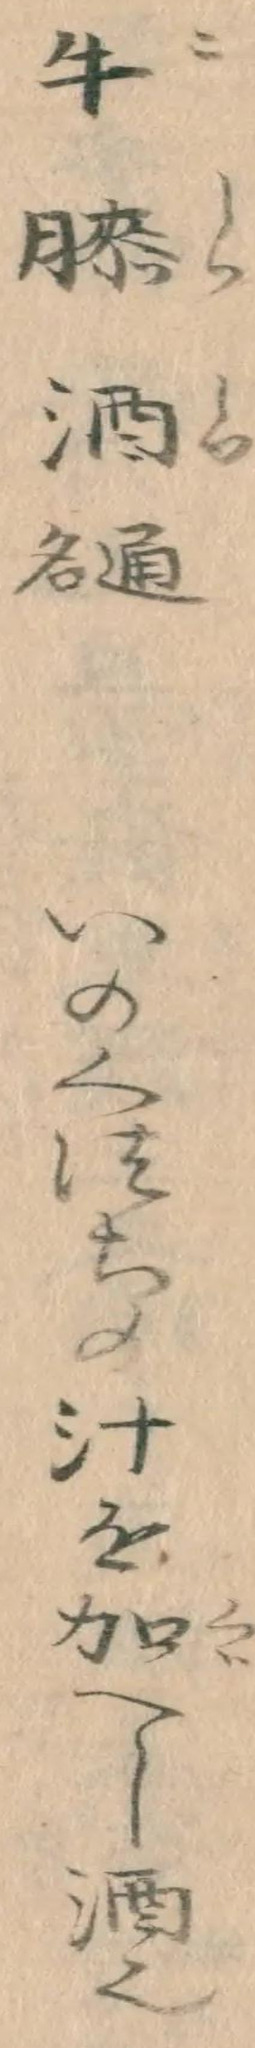牛膝酒通名いのくつちの汁を加へし酒也
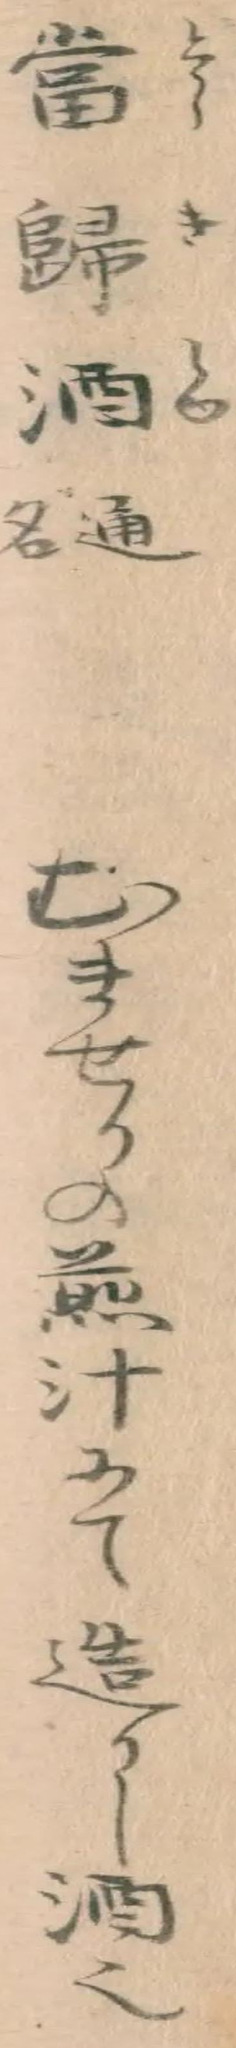当帰酒通名むませりの煎汁にて造りし酒也
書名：本草図譜. 巻43-45
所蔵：国立国会図書館 National Diet Library, JAPAN
